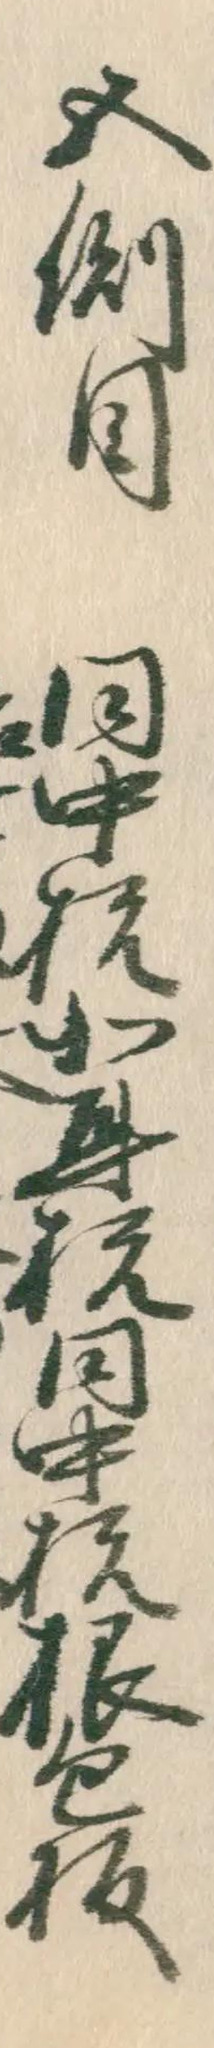五側目同中杭北耳杭同中杭根包板
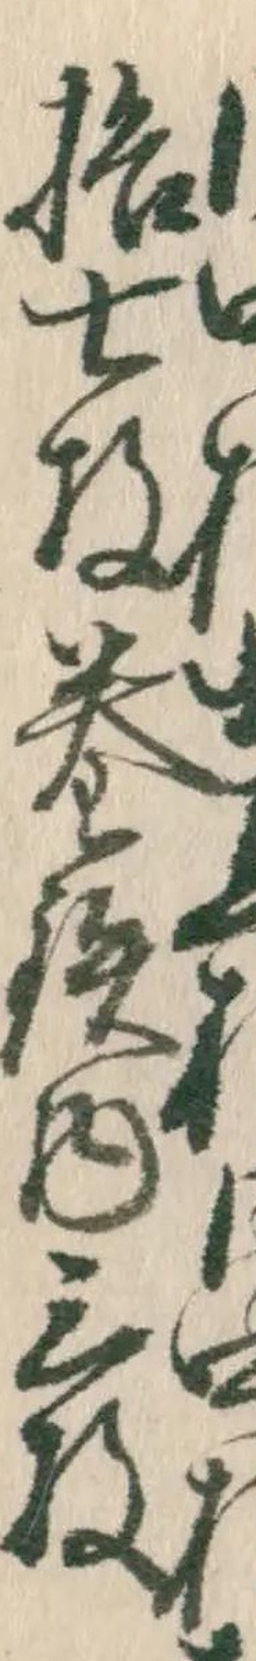拾七枚巻鉄物三枚
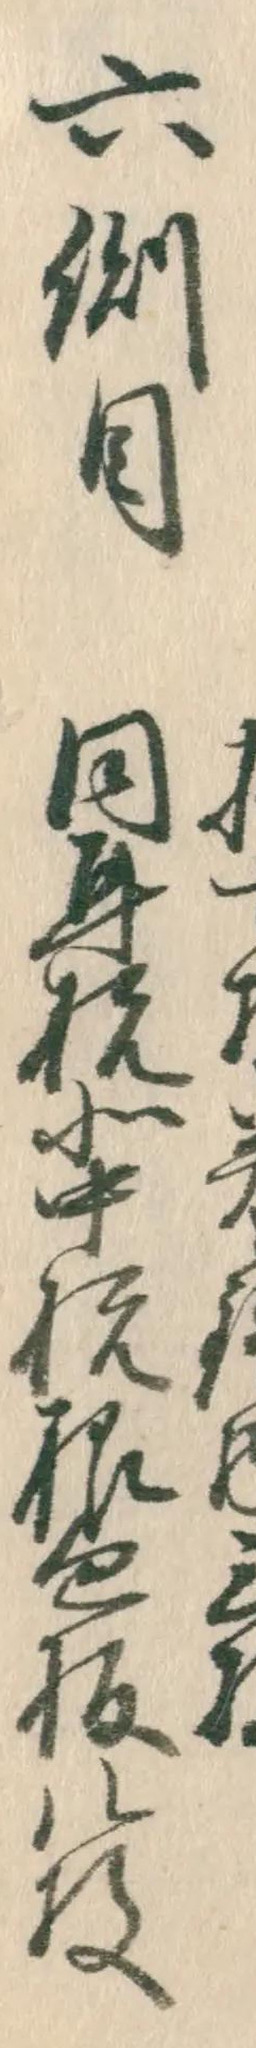六側目同耳杭北中杭根包板八枚
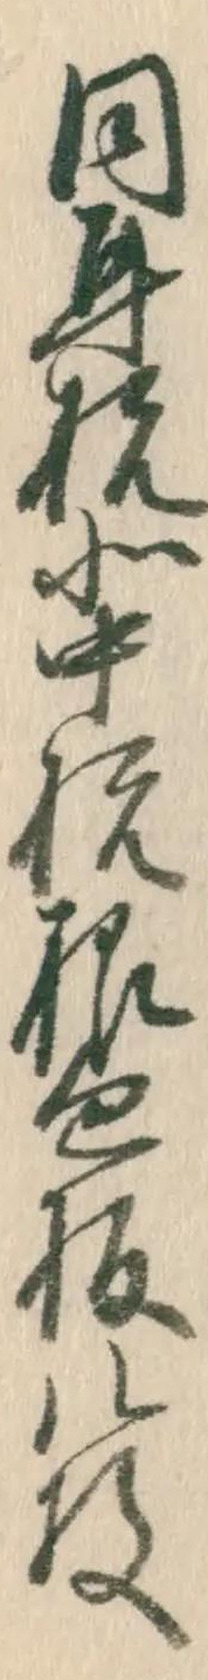六側目同耳杭北中杭根包板八枚

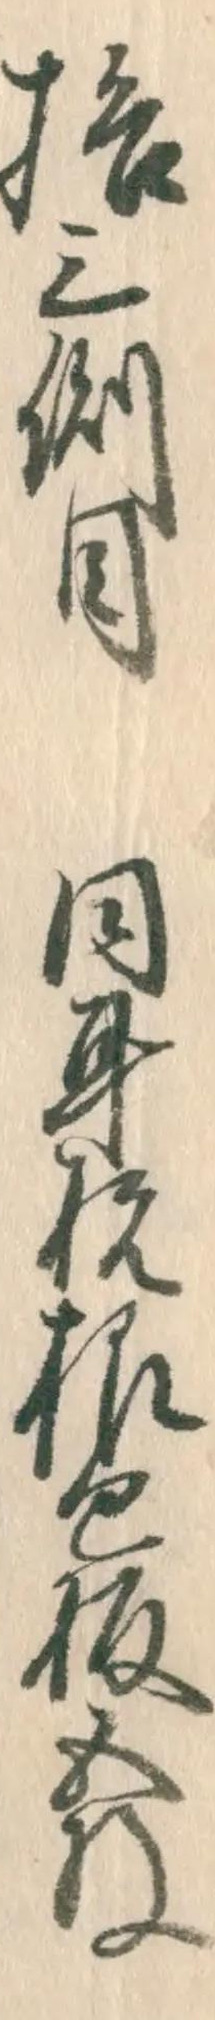拾三側目同耳杭根包板五枚
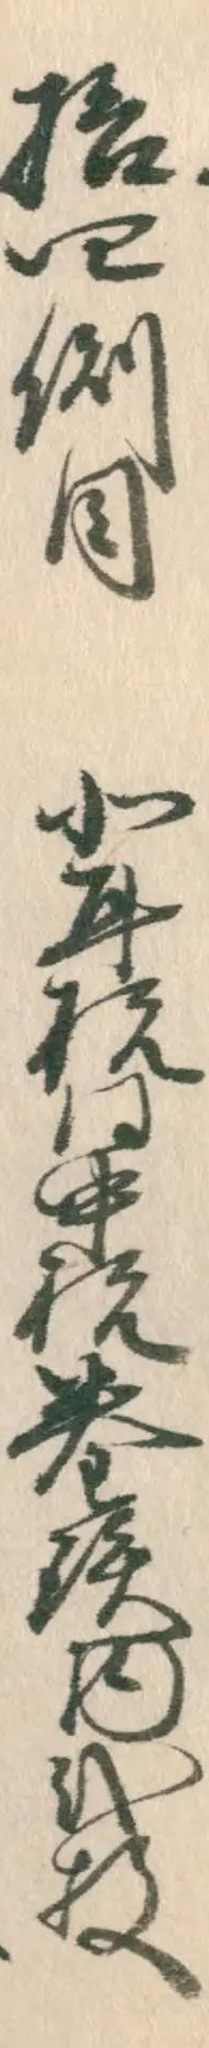拾四側目北耳杭同中杭巻鉄物弐枚
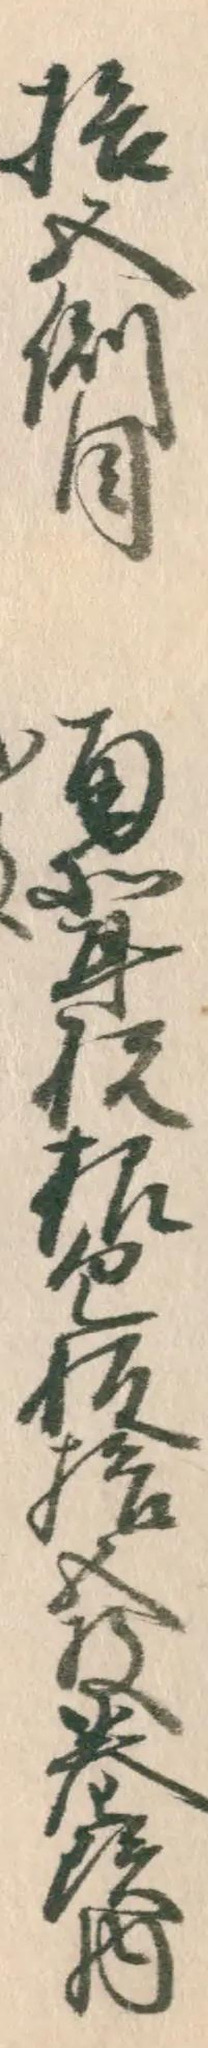拾五側目南北耳杭根包板拾五枚巻鉄物弐枚
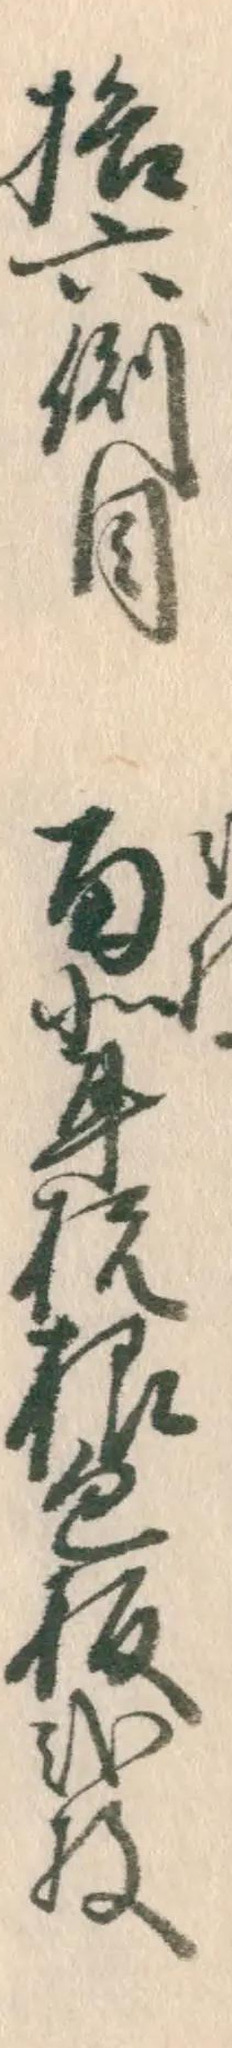拾六側目南北耳杭根包板弐枚
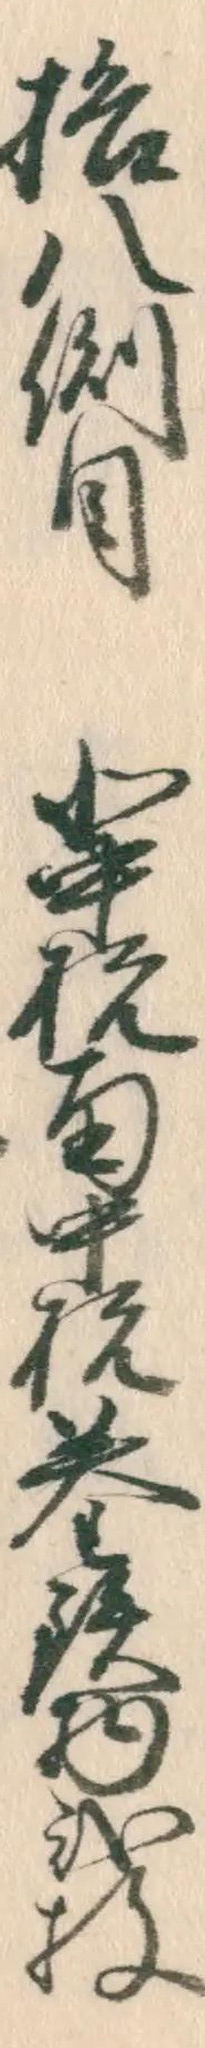拾八側目北中杭南中杭巻鉄物弐枚
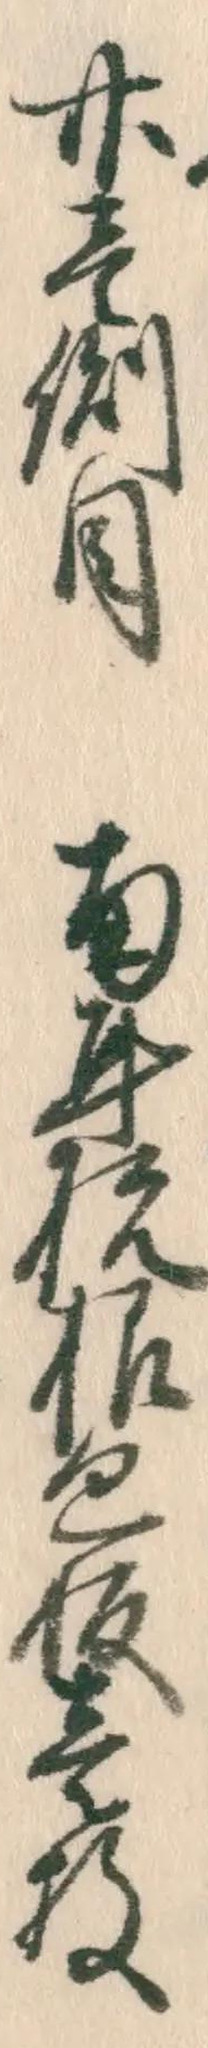廿壱側目南耳杭根包板壱枚
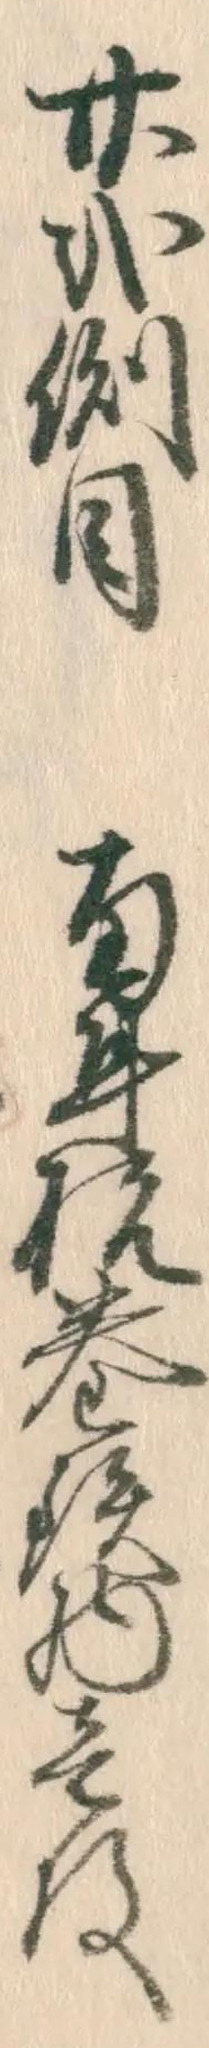廿弐側目南耳杭巻鉄物壱枚
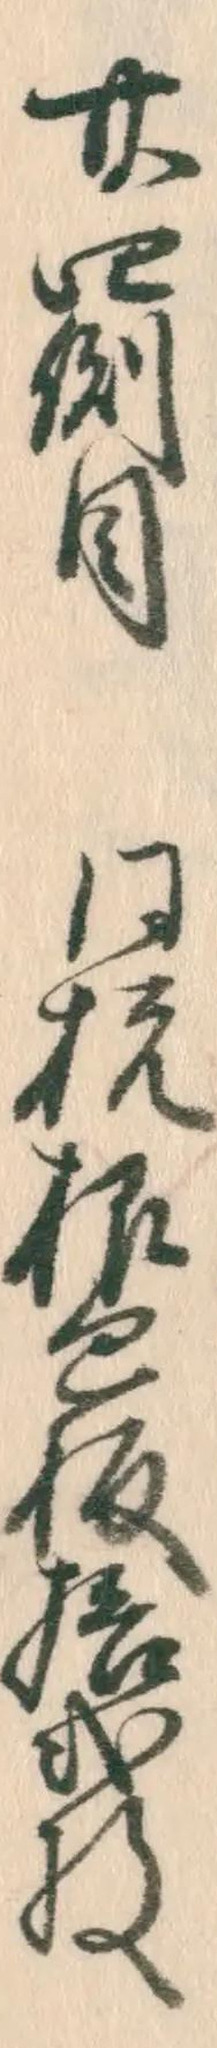廿四側目同杭根包板拾弐枚
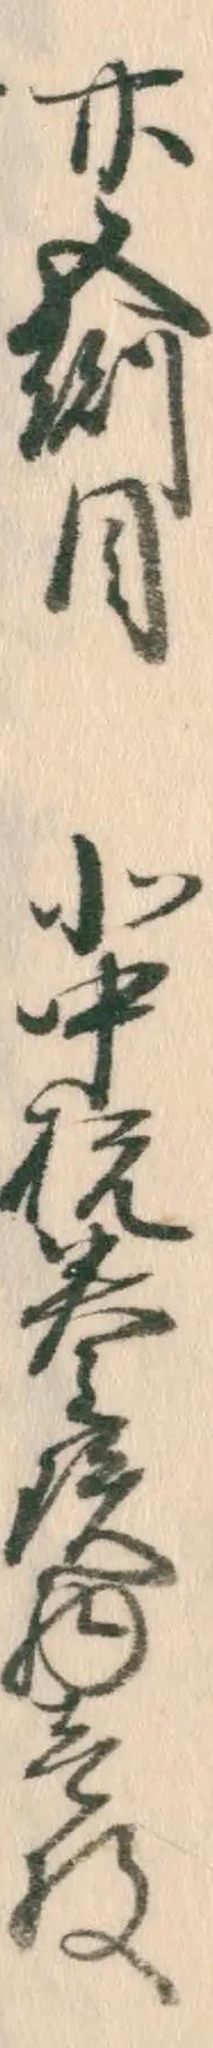廿五側目北中杭巻鉄物壱枚
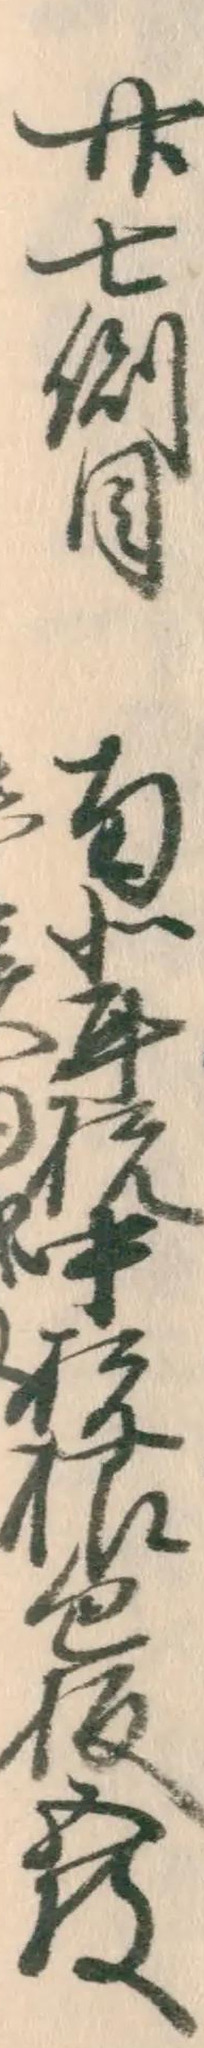廿七側目南北耳杭中杭根包板五枚
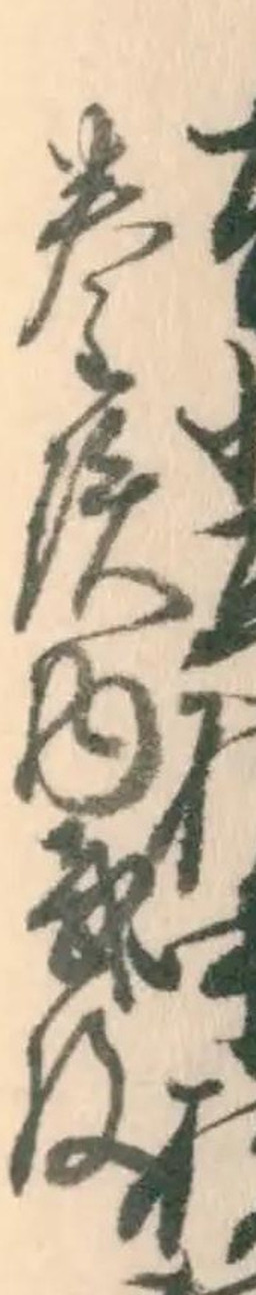巻鉄物弐枚
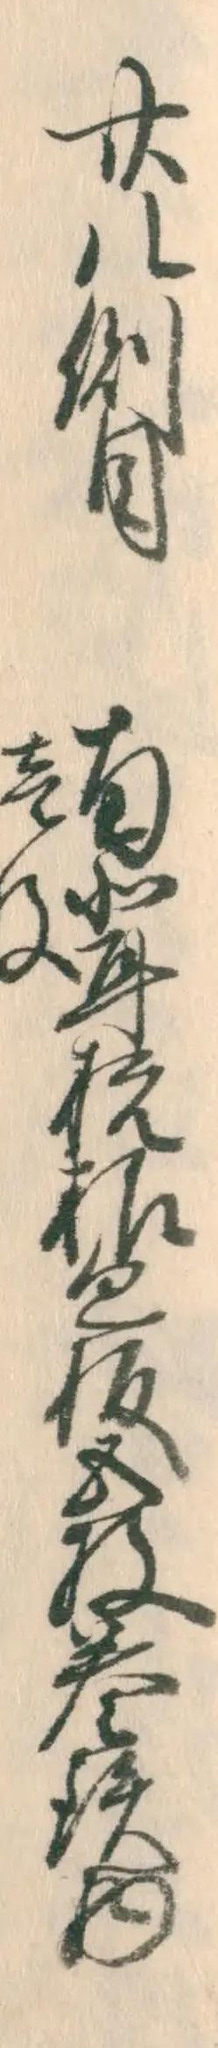廿八側目南北耳杭根包板五枚巻鉄物壱枚
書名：三橋 17巻. [8] 三橋小破御修復書留　但御奉行御掛リ替地震潰橋番屋　嘉永四亥年より安政二卯年迄　下
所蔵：国立国会図書館 National Diet Library, JAPAN
